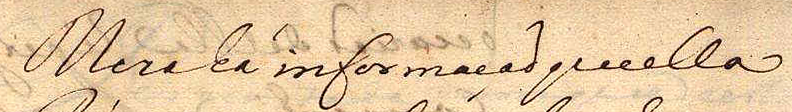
Meza há informaçaõ que ella
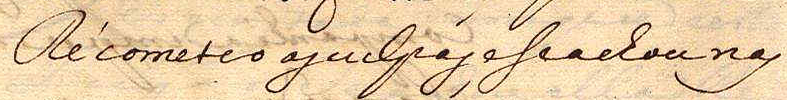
Ré cometeo as culpas, e se achou nas
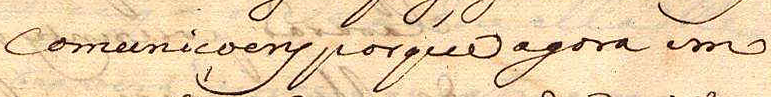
comuniçoens porque agora em
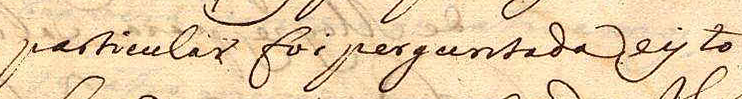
particular foi perguntada e isto
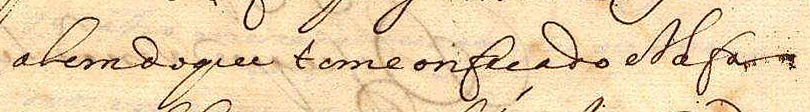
alem do que tem confeçado ella fa
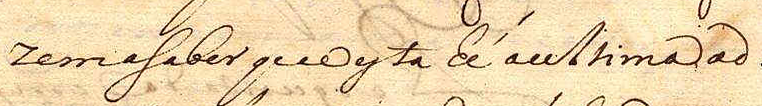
zem a saber que esta hé a ultima ad
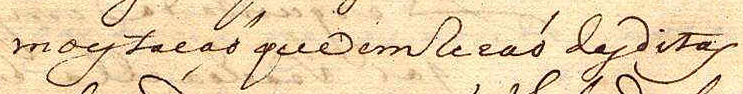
moestaçaõ que em Rezaõ das ditas
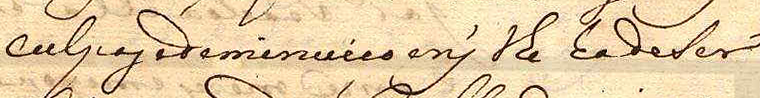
culpas e deminuiçoeñs lhe ha de Ser
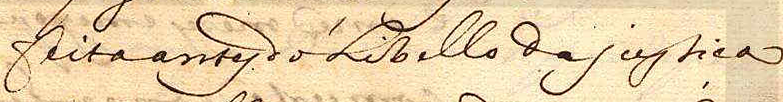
feita antes do Libello da justiça
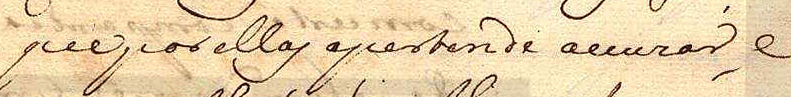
que por ellas a pertende accuzar, e
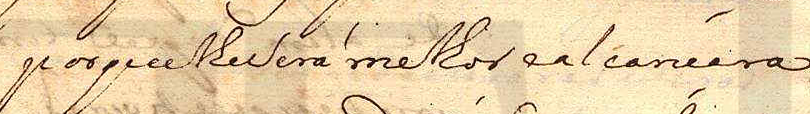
porque lhe será melhor e alcançara
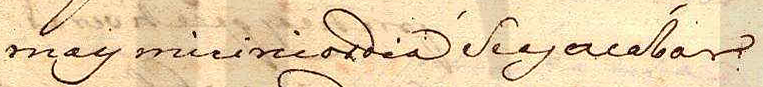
mais miziricordia se as acabar
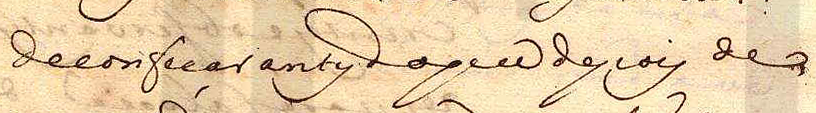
de confeçar antes do que depois de
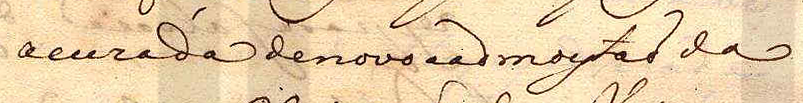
acuzada de novo e admoestaõ da
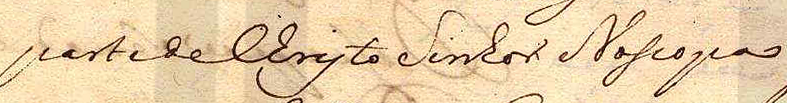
parte de Christo Senhor Nosso pa
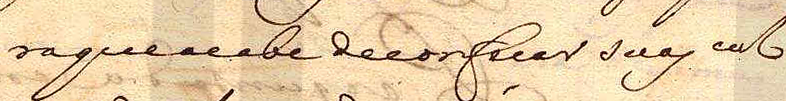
ra que acabe de confeçar suas cul
